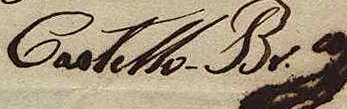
Castello- Br.o
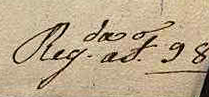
Reg.da a F. 98
